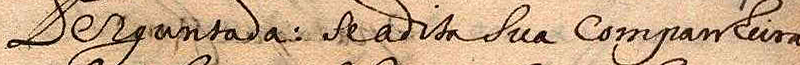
Perguntada: se a dita sua companheira
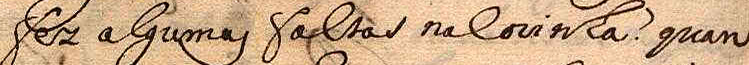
fez algumas faltas na Cozinha? quan
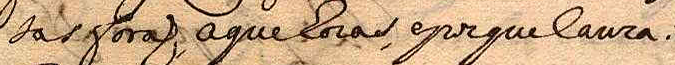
tas foraõ, a que horas, e porque Cauza?
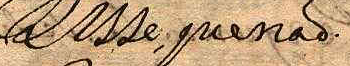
Disse, que naõ.
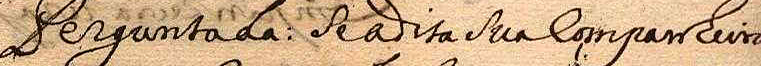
Perguntada: se a dita sua Companheira
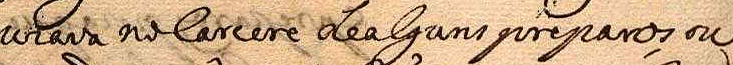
uzava no Carcere de alguns preparos, ou
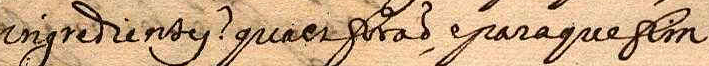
ingredientes? quaes foraõ, e para que fim?
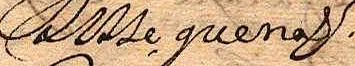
Disse, que naõ.
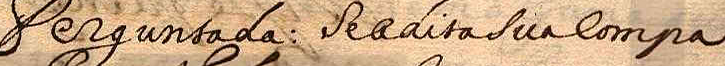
Perguntada: se a dita sua compa
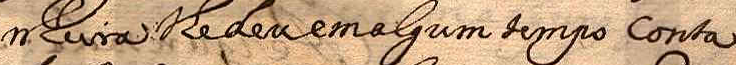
nheira lhe deu em algum tempo conta
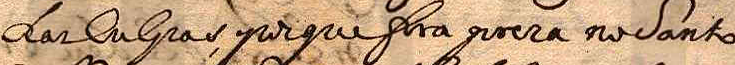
das Culpas, porque fora preza no Santo
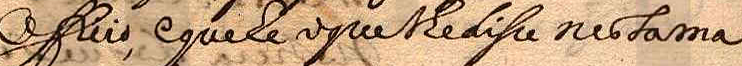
Officio, e que he o que lhe disse nesta ma
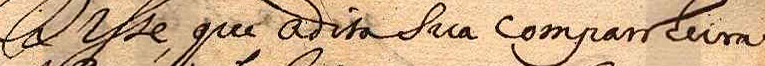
Disse, que a dita Sua companheira
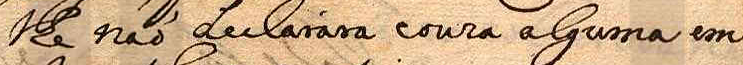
lhe naõ declarára couza alguma em
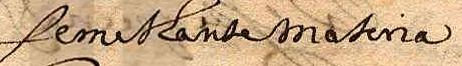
semelhante materia.
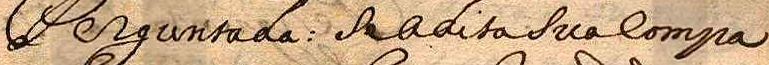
Perguntada: se a dita sua compa
